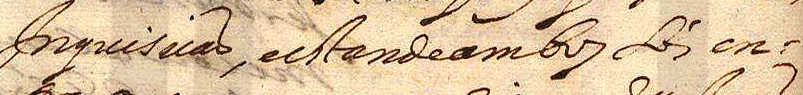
Jnquisicaõ, e estando ambos sós en
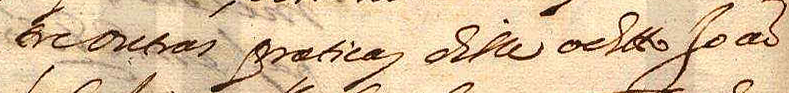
tre outras praticas disse o ditto Joaõ
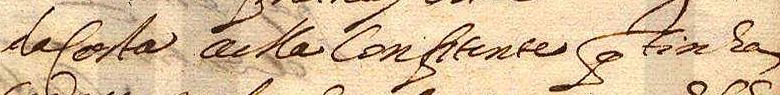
da Costa a ella confitente q̄ tinha
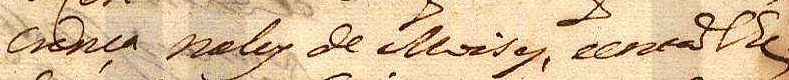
crença na ley de Moises, e entaõ lhe
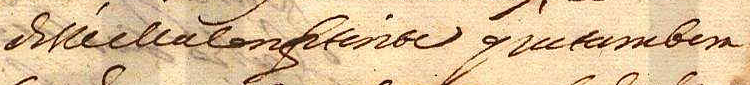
disse ella confitente que tambem
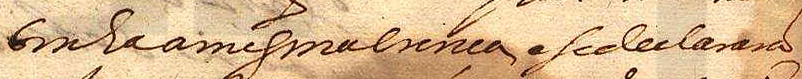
tinha a mesma crença, e se declararaõ
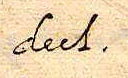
decl.
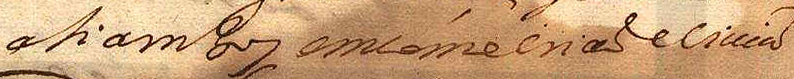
asi ambos em como criaõ e viuiaõ
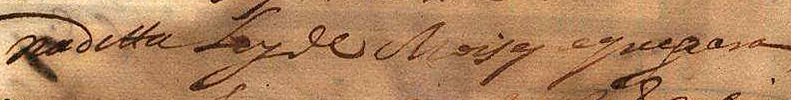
na ditta Ley de Moises e que para
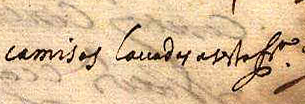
camisas lauadas a sesta fra.
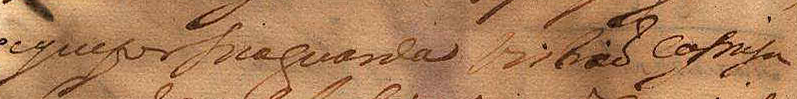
e que por sua guarda vistiaõ camisa
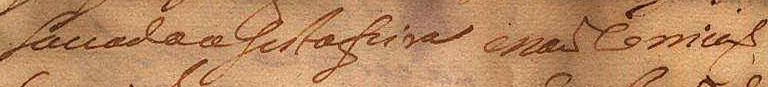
lauada a sesta feira e naõ comiaõ
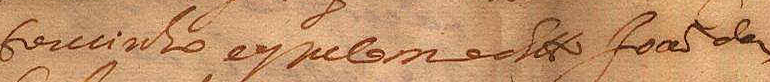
toucinho e que com o ditto Joaõ da
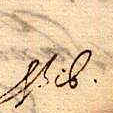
ꝓhib.
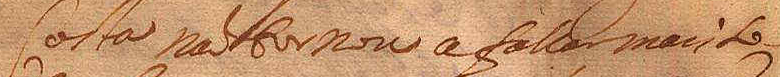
Costa naõ tornou a fallar mais so
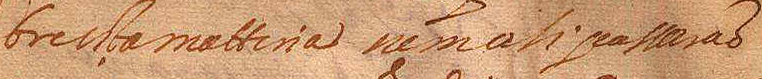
bre esta matteria nem ali passaraõ
